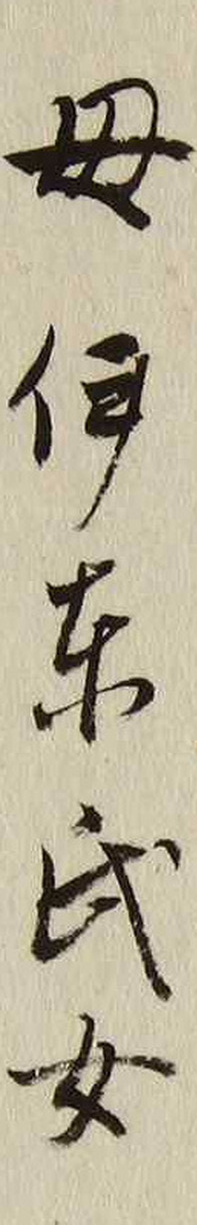母伊東氏女
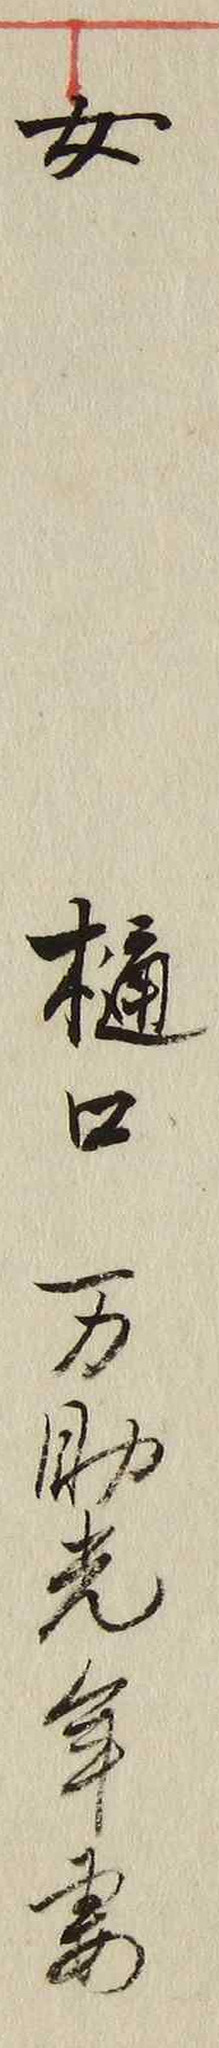女樋口万助光年妻
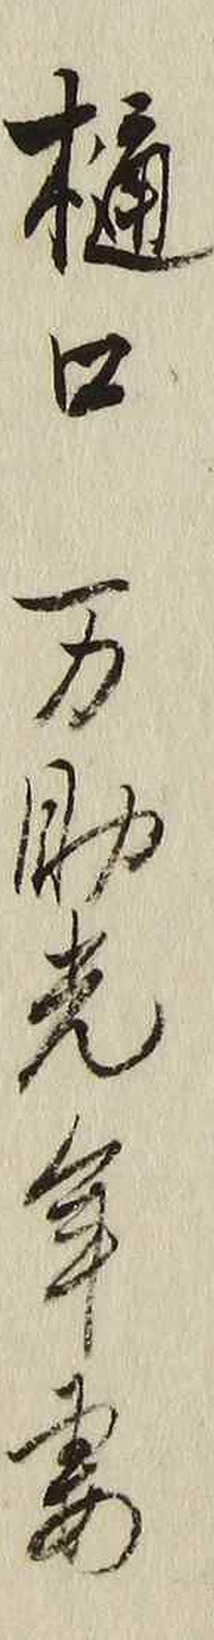女樋口万助光年妻
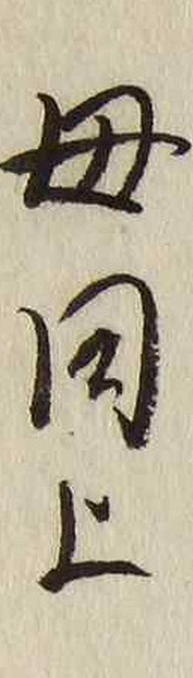母同上

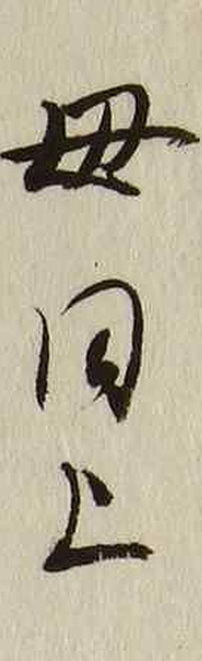母同上
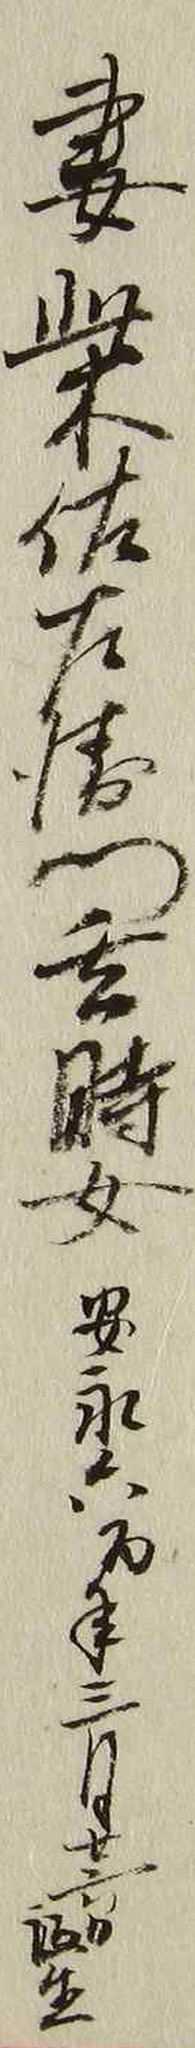妻柴佐左衛門玄時女安永六酉年三月廿六日誕生
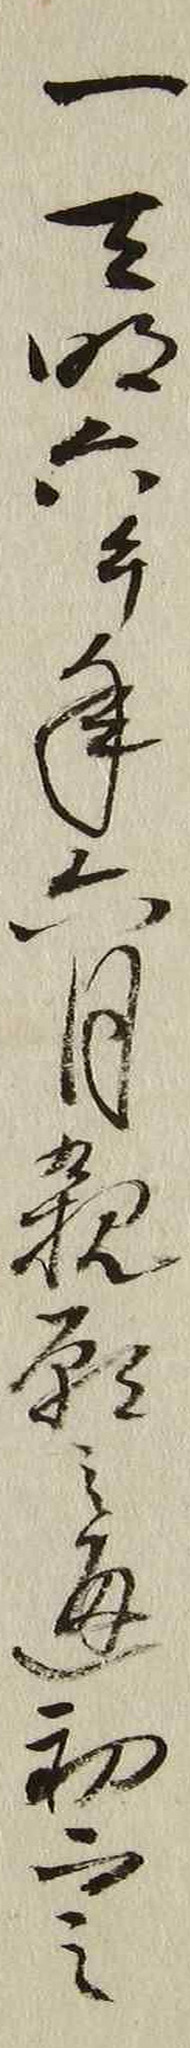一天明六午年六月親願之通初而之
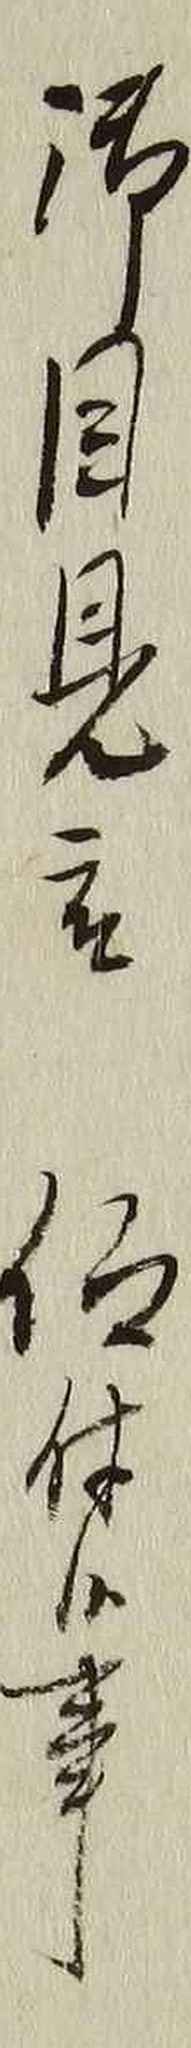御目見被仰付候事
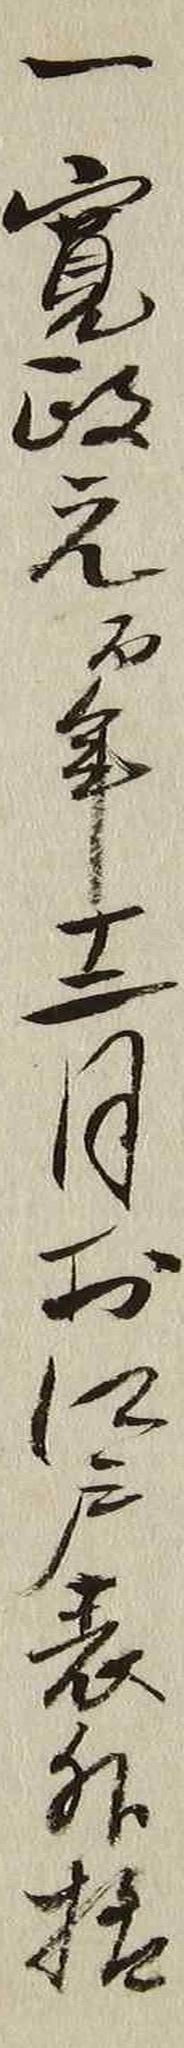一寛政元酉年十二月於江戸表外様
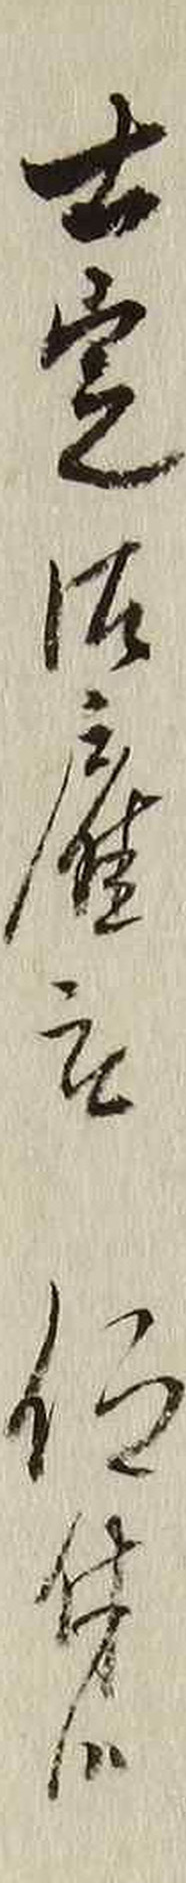士定御雇被仰付候
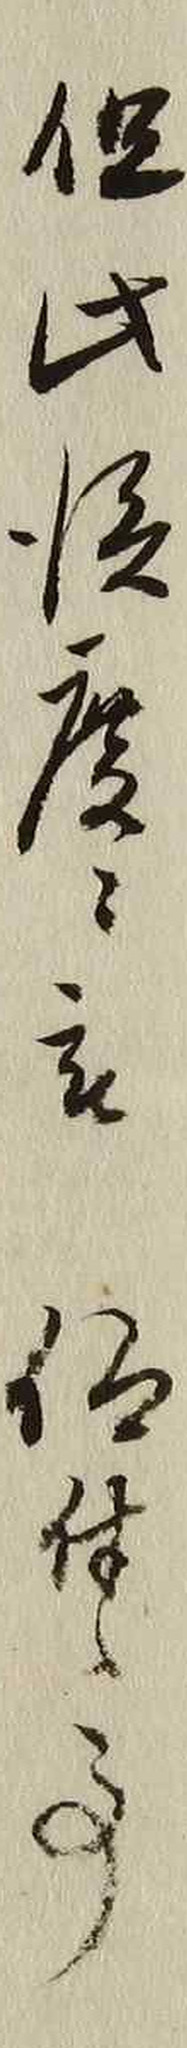但此後度々被仰付候事
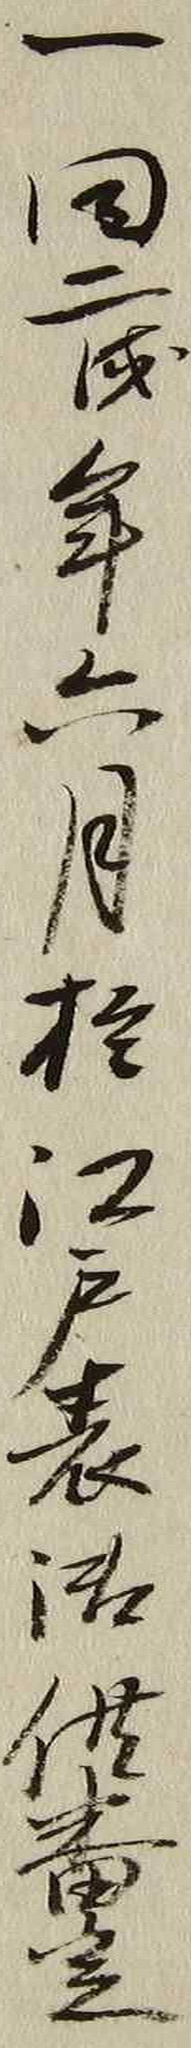一同二戌年六月於江戸表御供番定
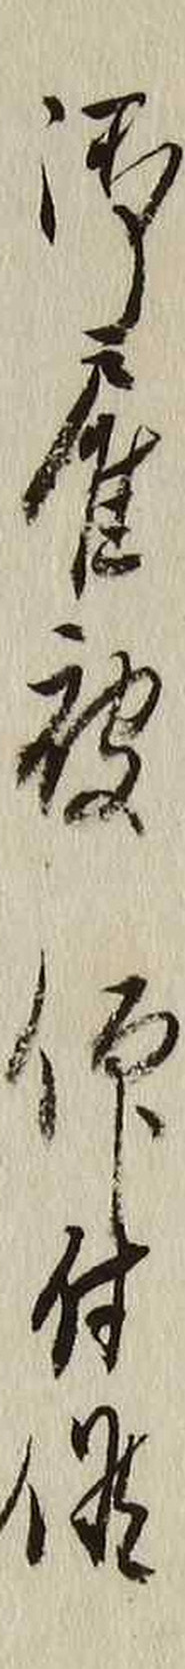御雇被仰付候
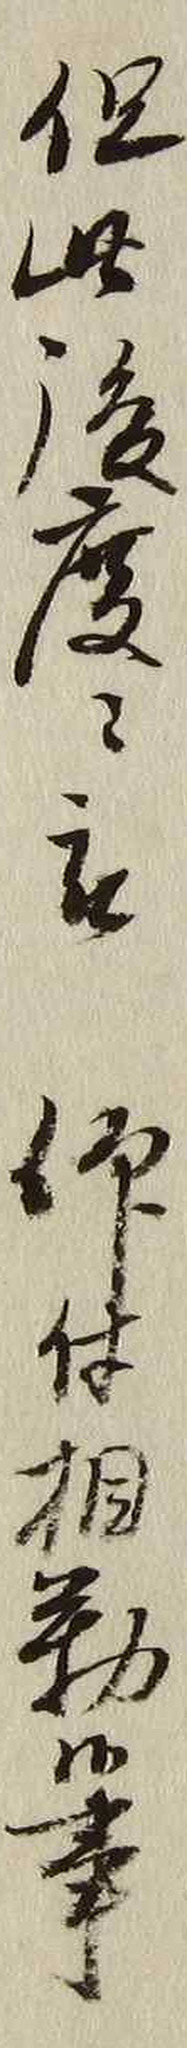但此後度々被仰付相勤候事
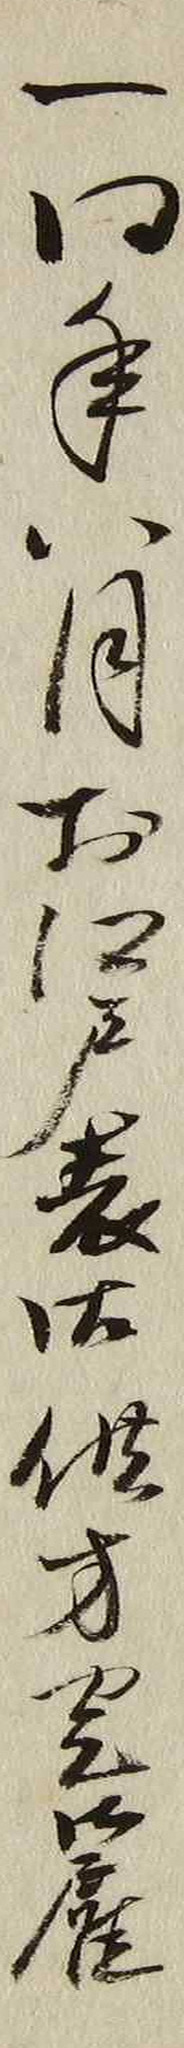一同年八月於江戸表御供方定御雇
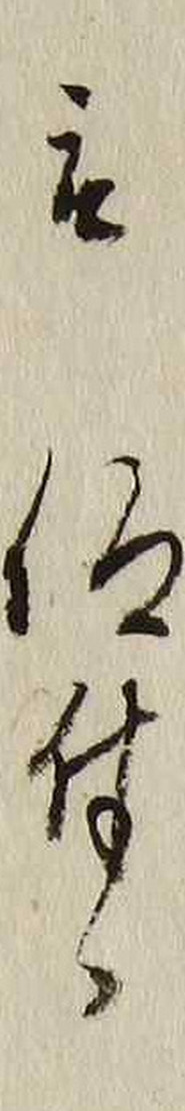被仰付候
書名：諸士系譜　巻之352　す之部2
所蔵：会津若松市立会津図書館
